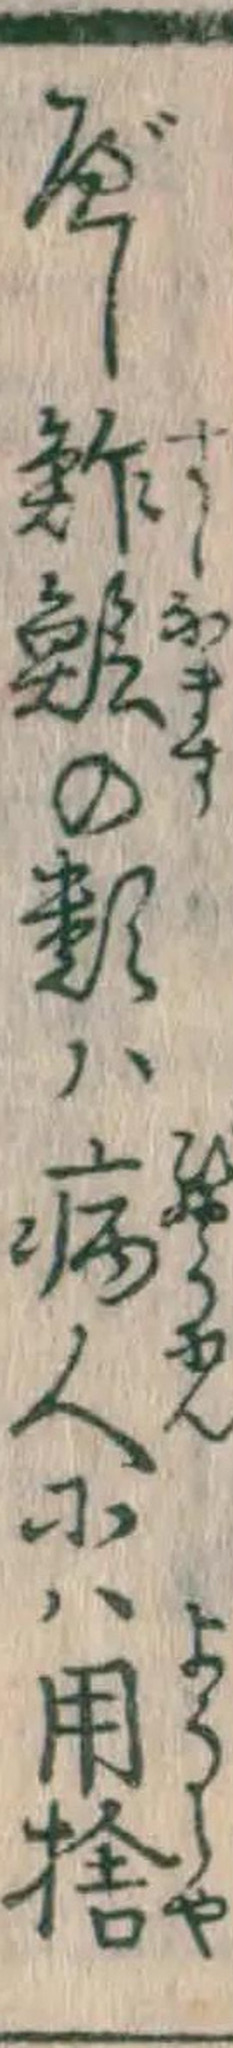べし鮓鱠の類は病人には用捨
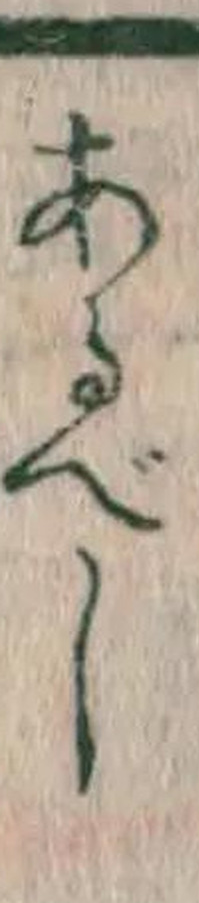あるべし
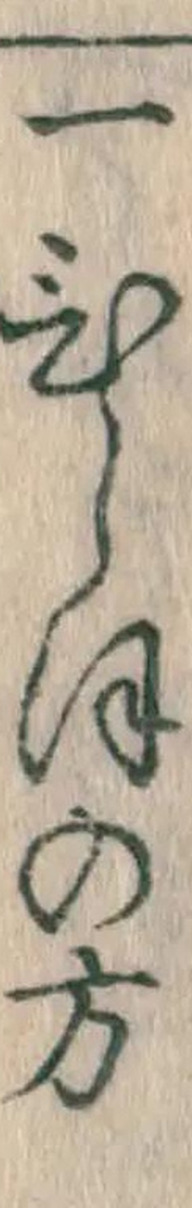一ひしほの方
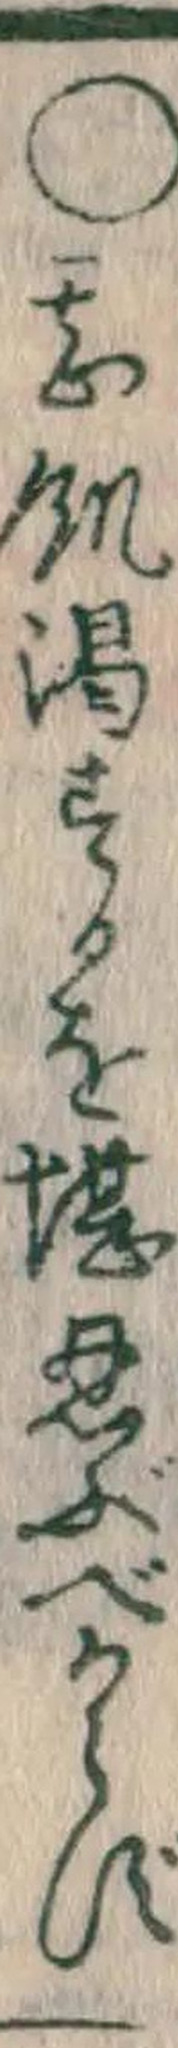○甚飢渴するを堪忍ぶべからず
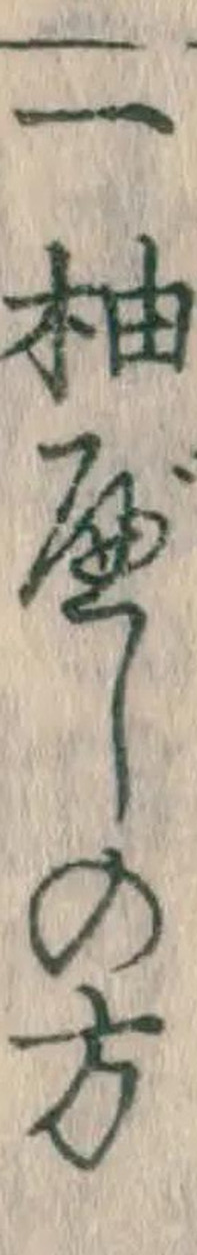一柚べしの方
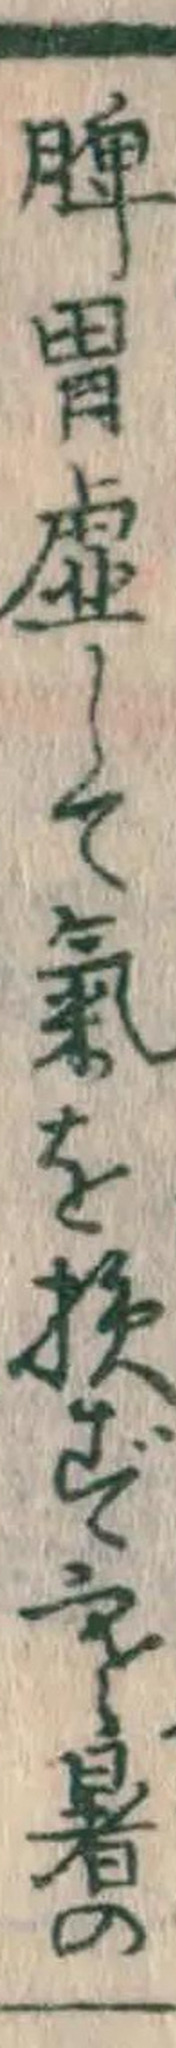脾胃虚して気を損ず寒暑の
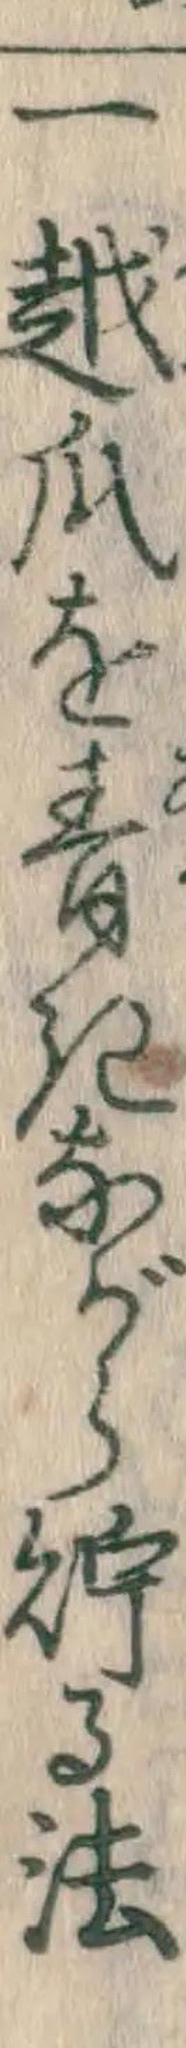一越瓜を青きながら貯る法
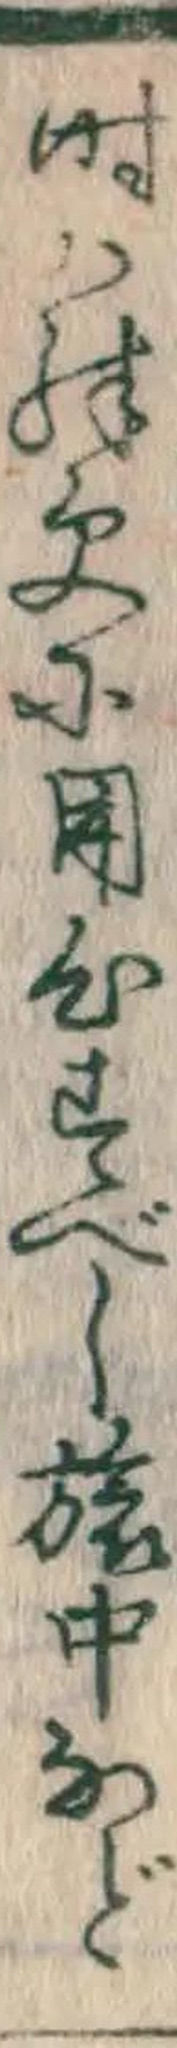時は殊更に用心すべし旅中など
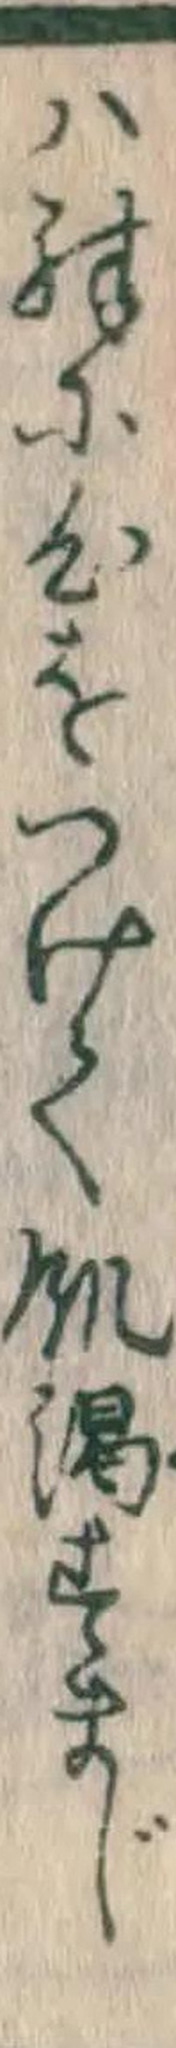は殊に心をつけて飢渇すまじ
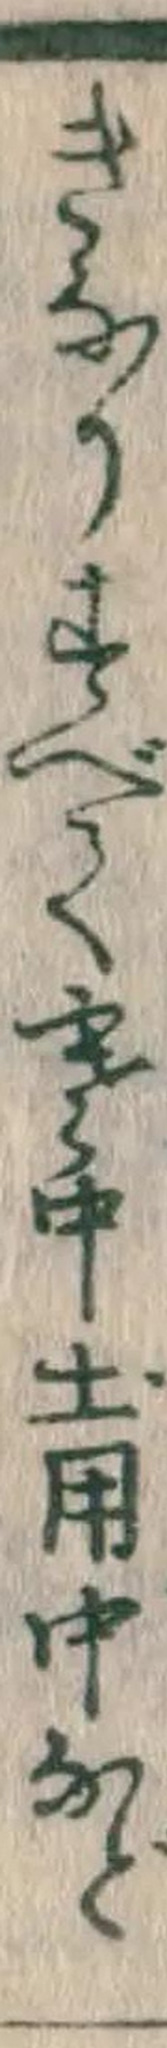きなりすべて寒中土用中など
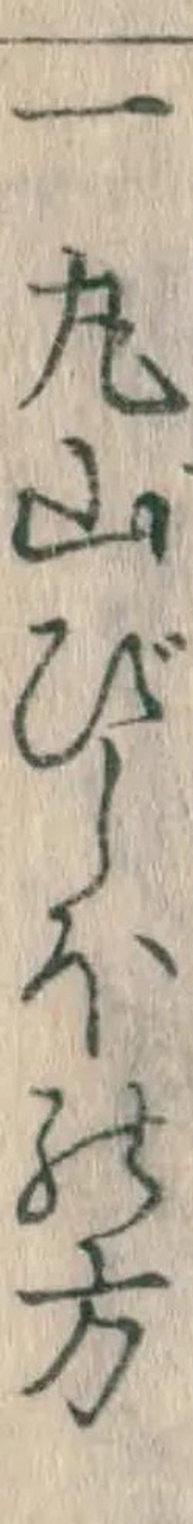一丸山びしほの方
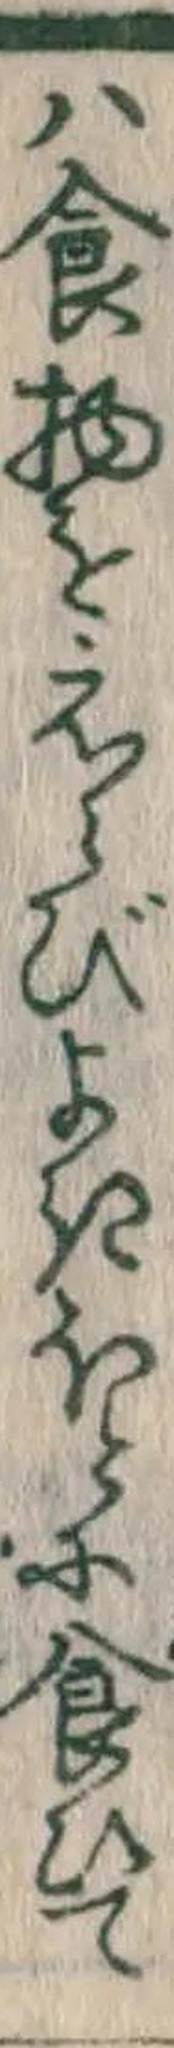は食物をえらびよきほとに食ひて
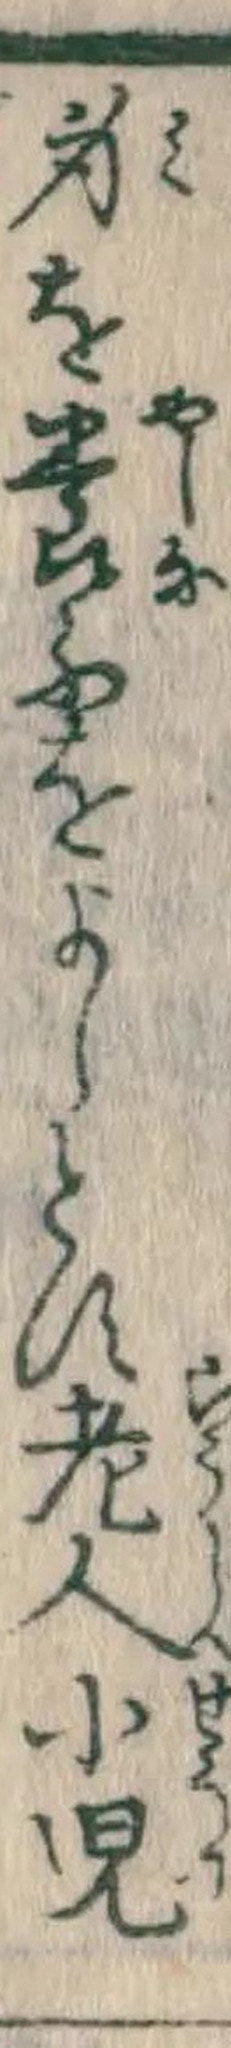身を養ふをよしとす老人小児
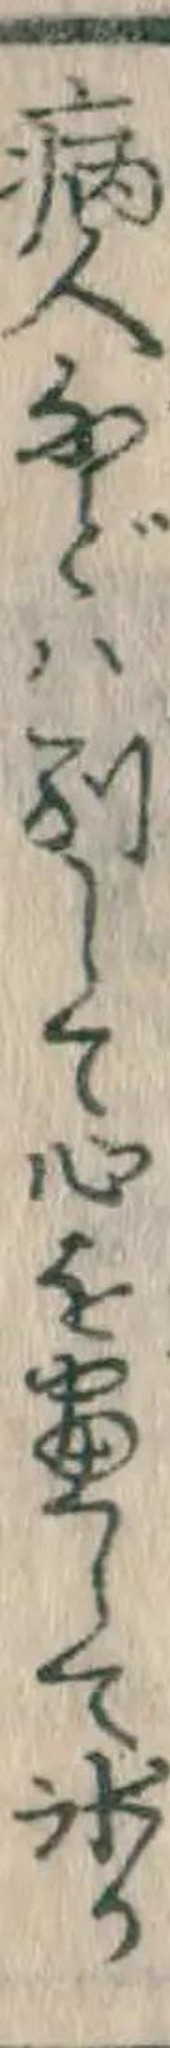病人などは別して心を尽して氷り
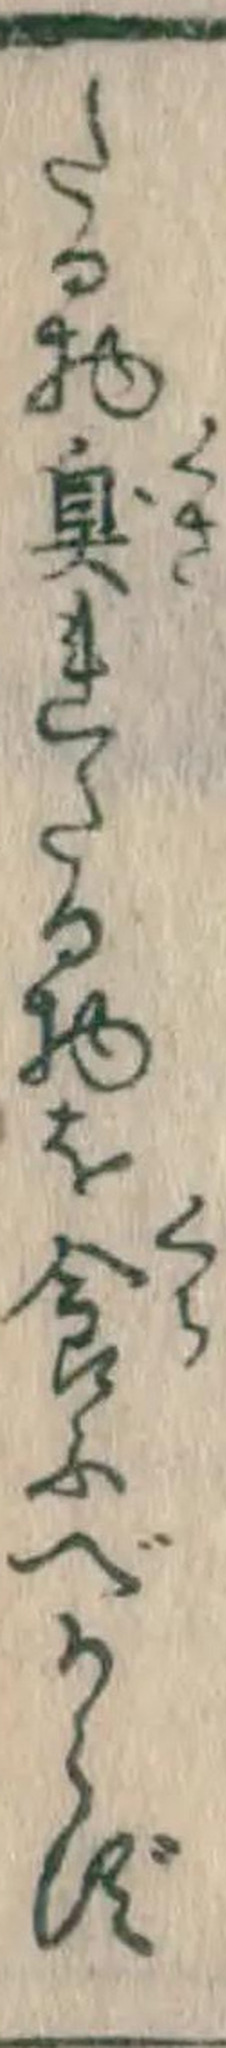たる物臭れたる物を食ふべからず

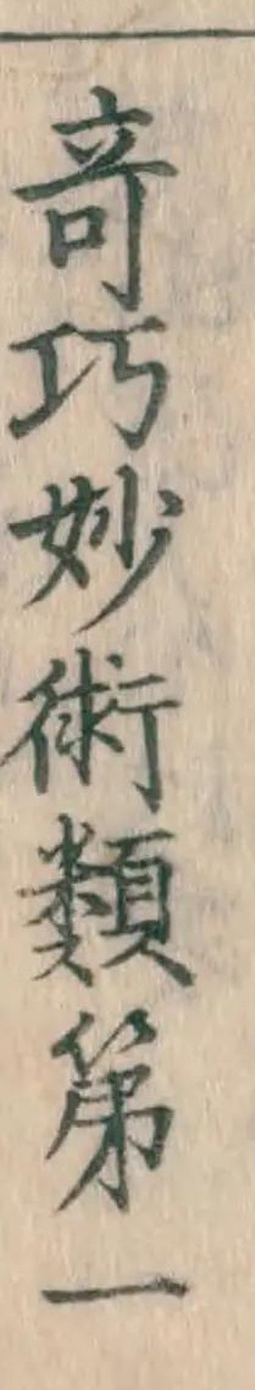奇巧妙術類第一
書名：広益秘事大全 3巻. [1]
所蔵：国立国会図書館 National Diet Library, JAPAN
